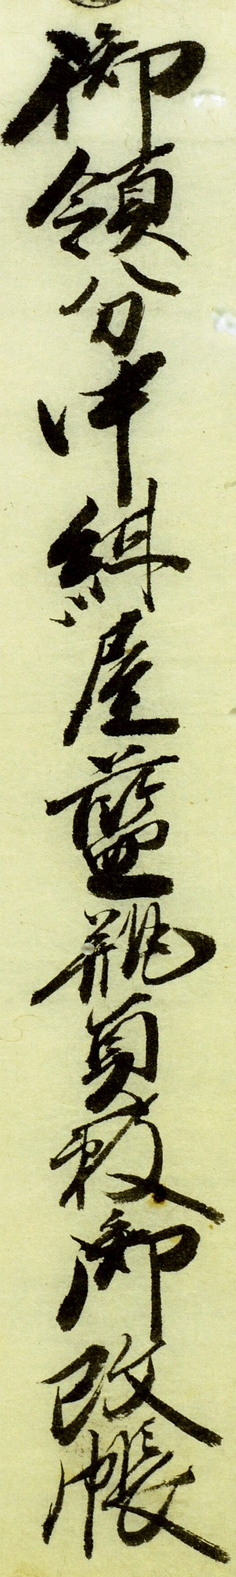印御領分中紺屋藍瓶員数御改帳

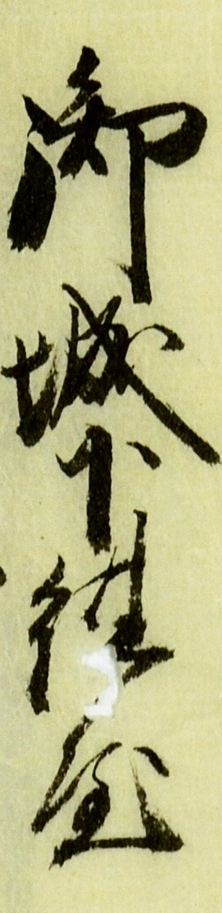御城下紺屋
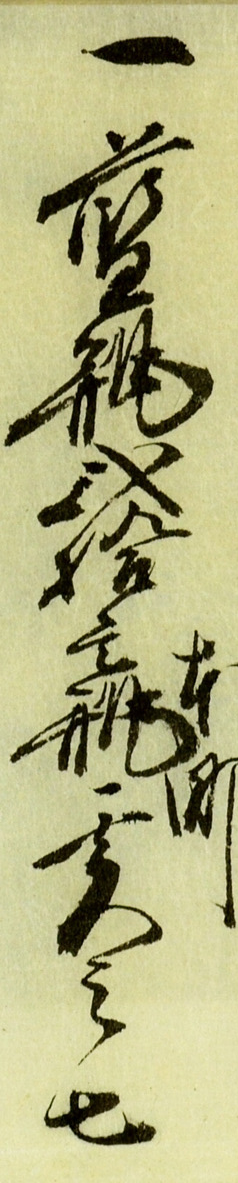一藍瓶弐拾壱瓶亥之七
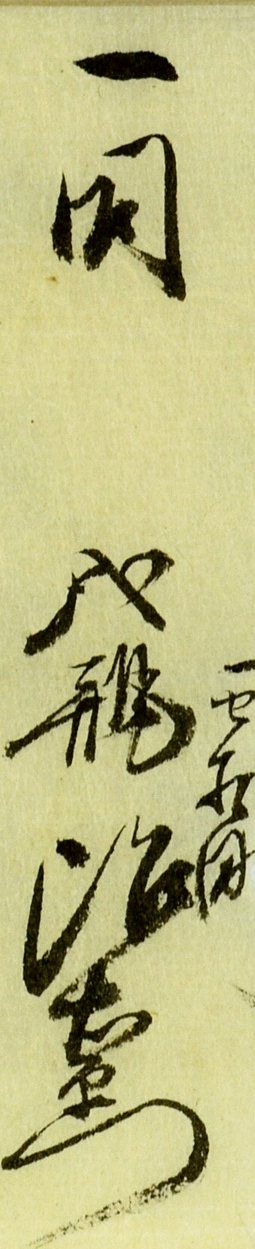一同弐瓶治右衛門
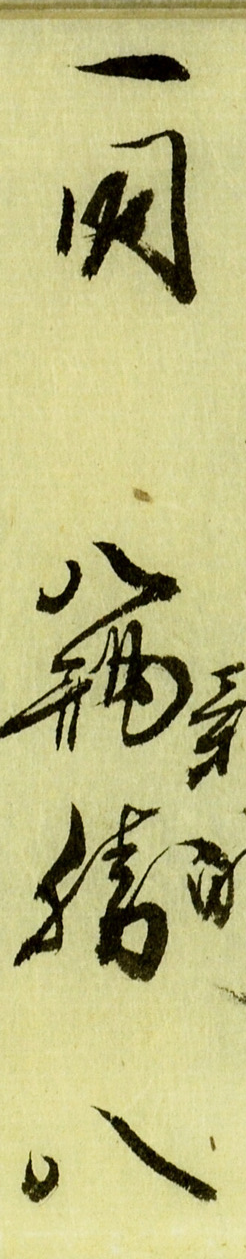一同八瓶勝八
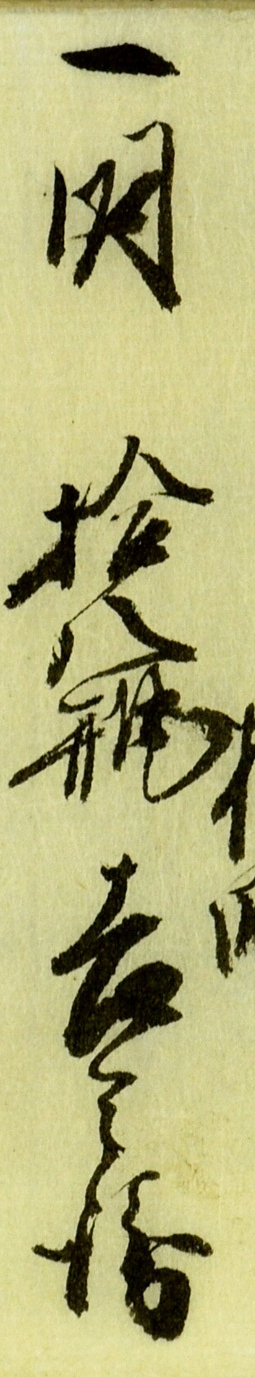一同拾八瓶吉兵衛
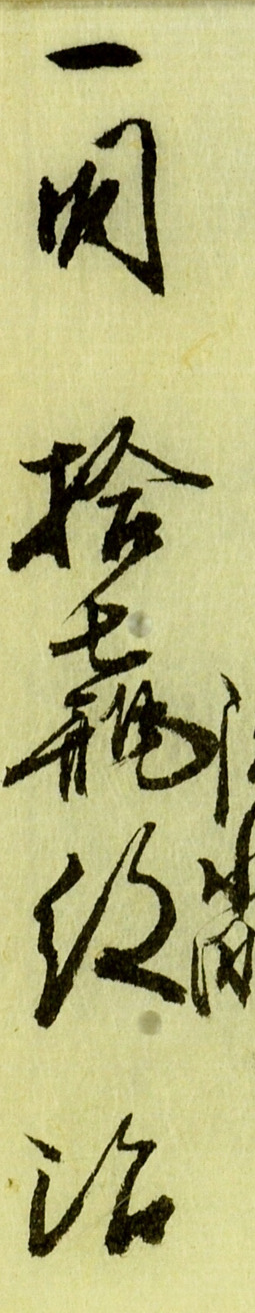一同拾七瓶紋治
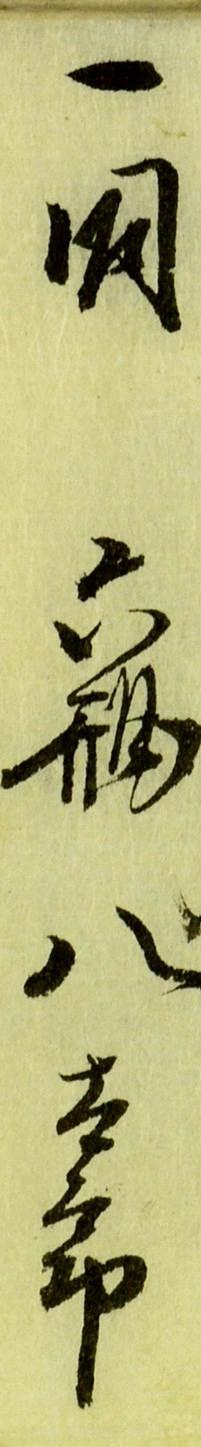一同六瓶八太郎
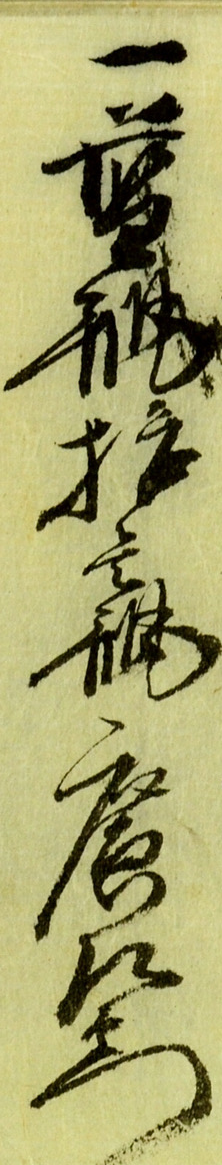一藍瓶拾壱瓶広左衛門

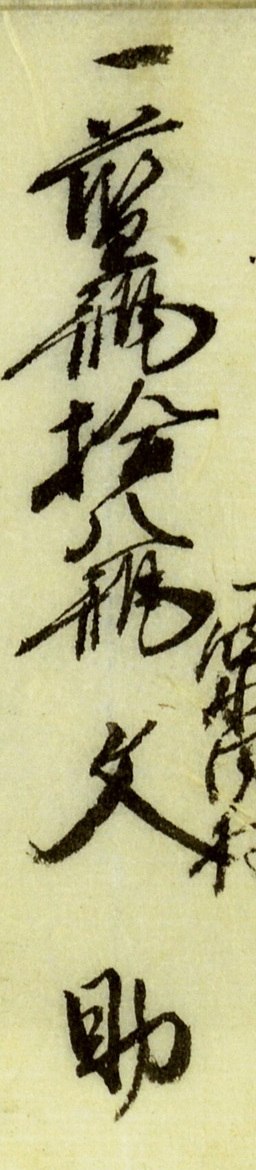一藍瓶拾八瓶文助
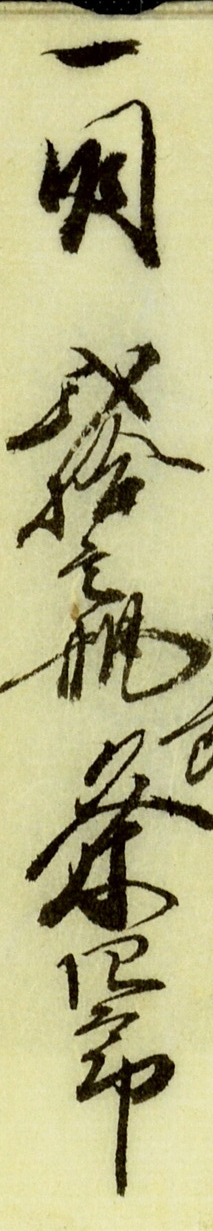一同弐拾壱瓶粂四郎
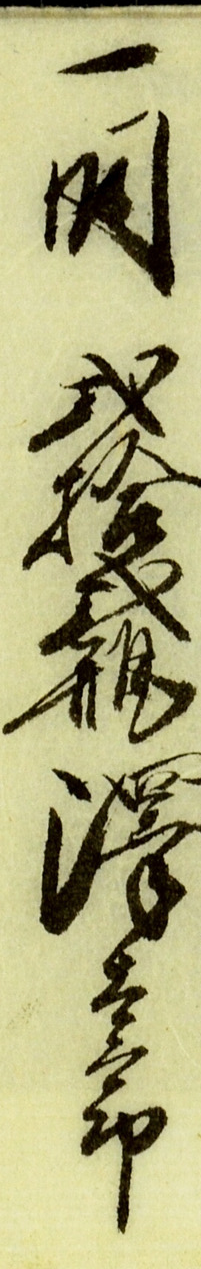一同弐拾弐瓶沢太郎
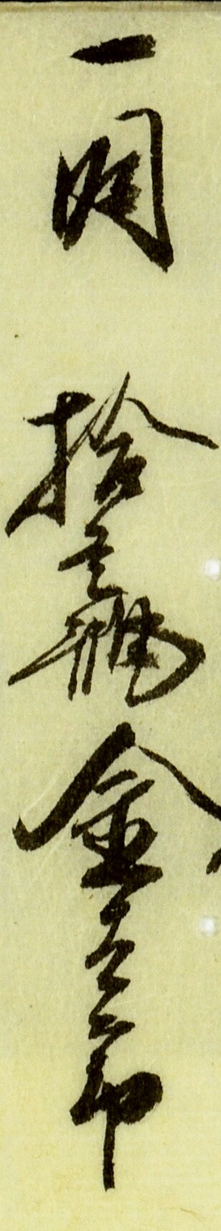一同拾壱瓶金太郎
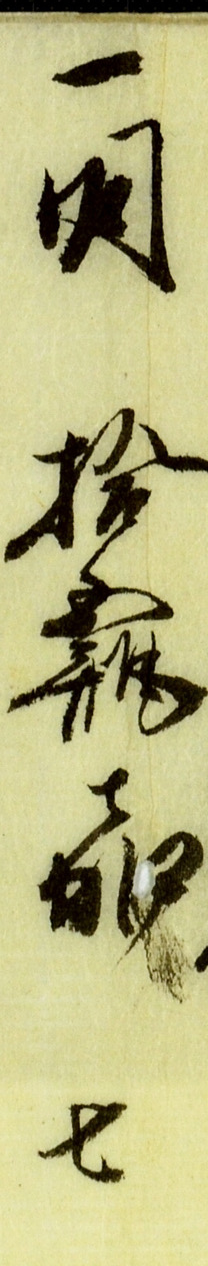一同拾五瓶嘉七
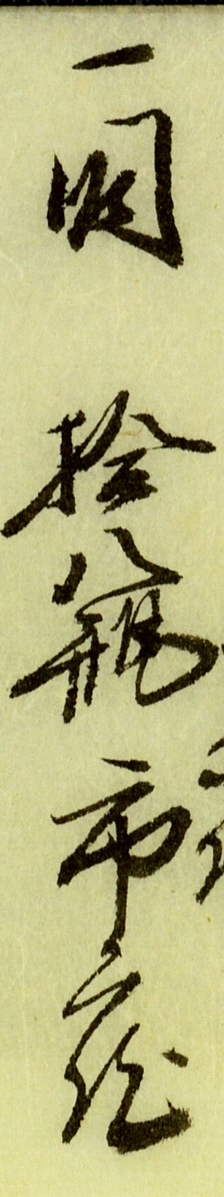一同拾八瓶市蔵
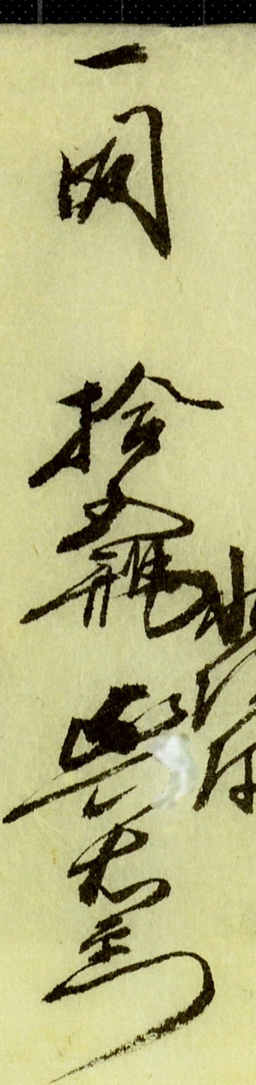一同拾五瓶与右衛門
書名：御領分中御領分中紺屋藍瓶員数御改帳
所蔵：伊那市立高遠町図書館・合同会社AMANE
